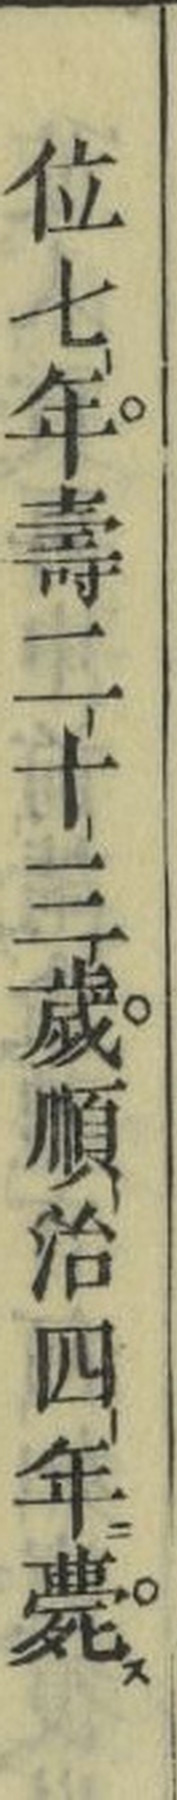位七-年。寿二-十-三-歳。順-治四-年薨。
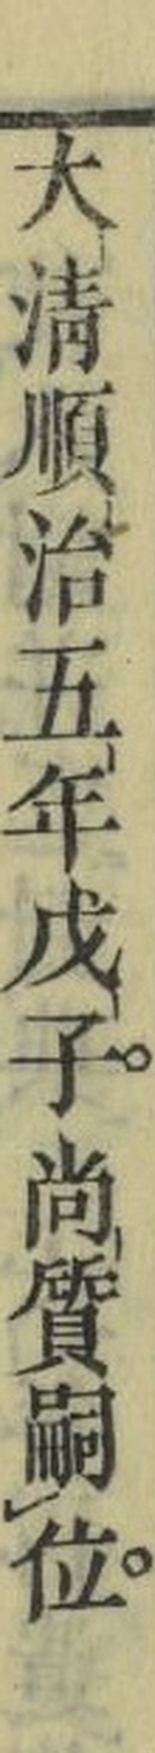大-清順-治五-年戌-子。尚-質嗣位。

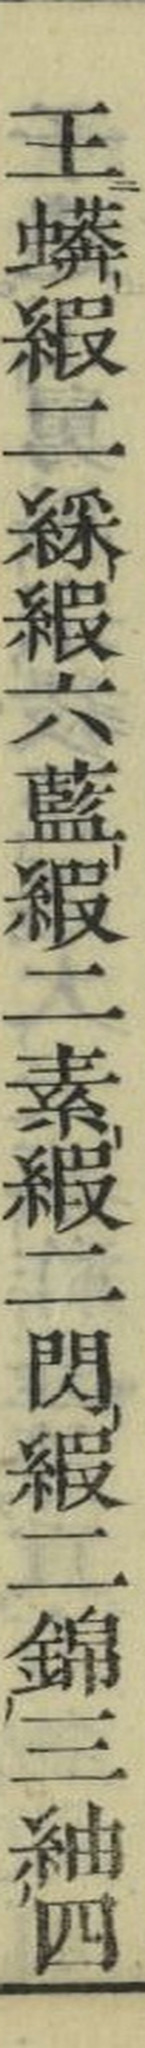王蟒-緞二綵-緞六藍-緞二素-緞二閃-緞二錦-三紬-四
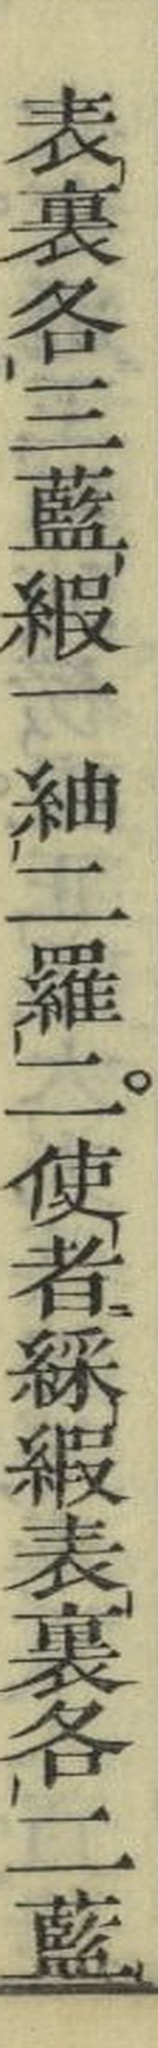表-裏各-三藍-緞一紬-二羅-二。使-者綵-緞表-裏各-二藍-
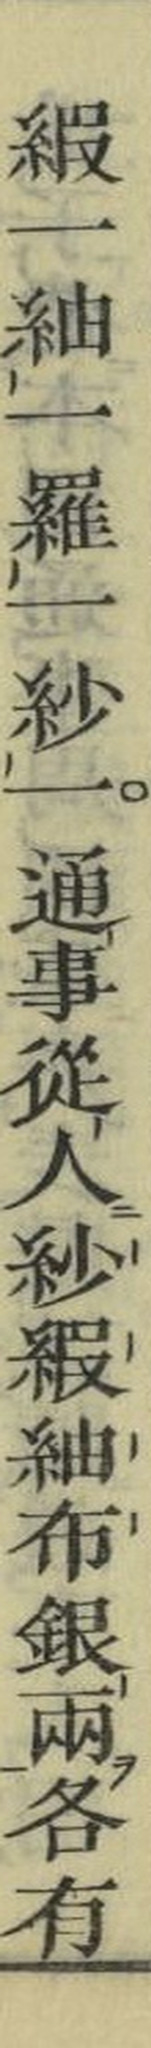緞一紬-一羅-一紗-一。通-事従-人紗緞紬布銀-両各有

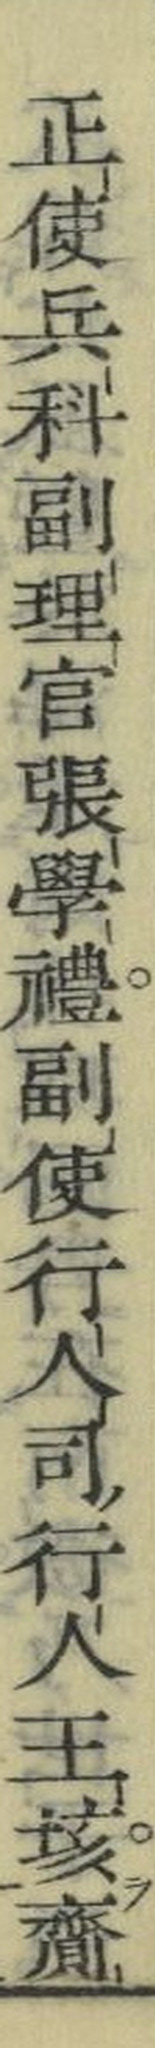正-使兵-科副-理-官張-学-礼。副-使行-人-司行-人王-垓。齎-
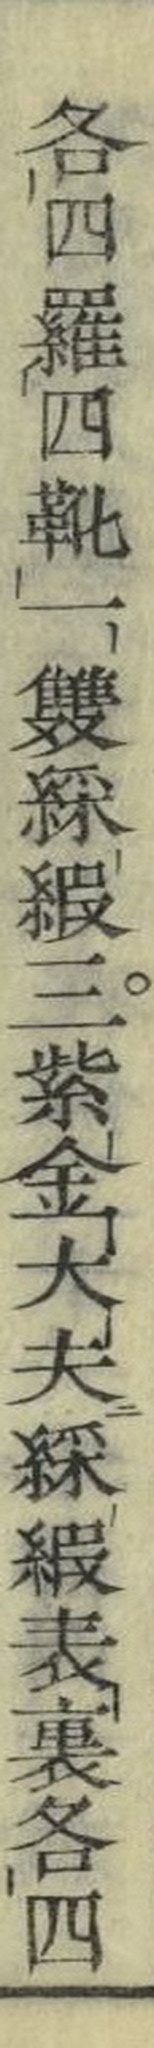各-四羅-四靴-一-双綵-緞三。紫-金-大-夫綵-緞表-裏各-四
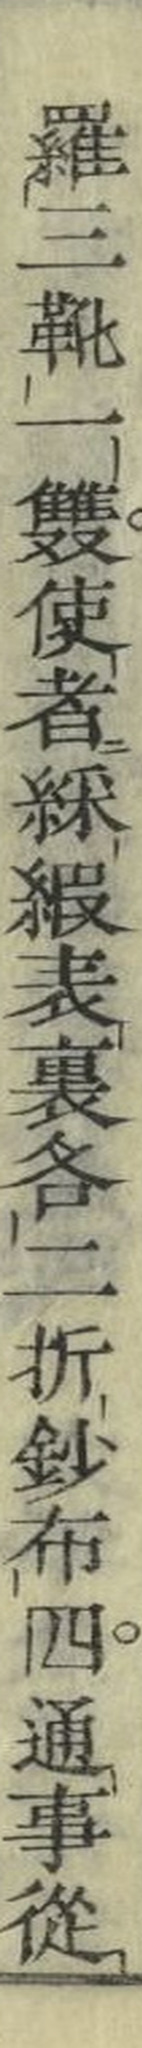羅-三靴-一-双。使-者綵-緞表-裏各-二折-鈔布-四。通-事従-

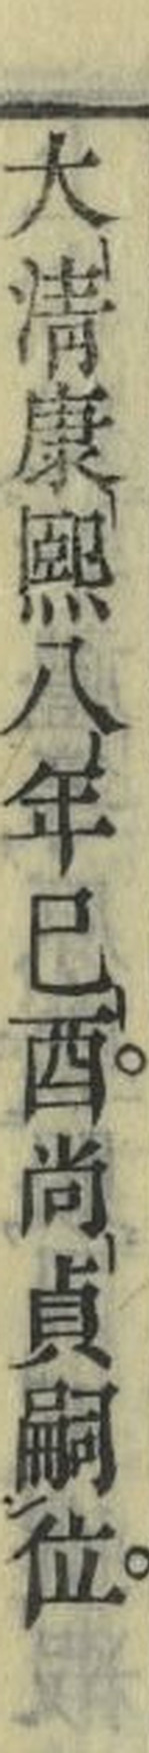大-清康-煕八-年巳-酉。尚-貞嗣位。
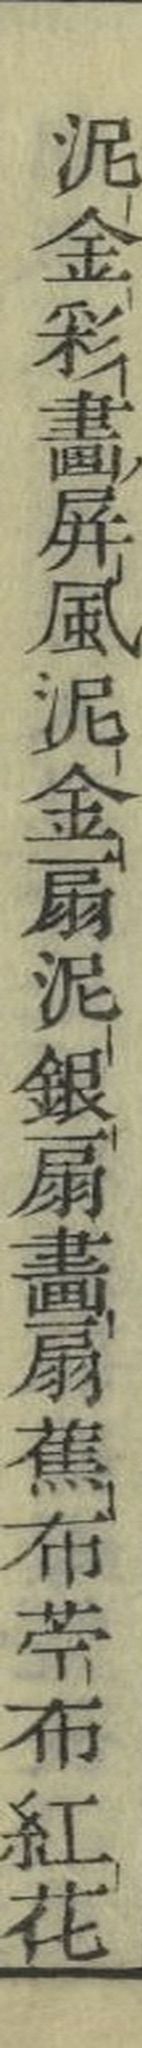泥-金-彩-画屏-風泥-金-扇泥-銀-扇画-扇蕉-布苧-布紅-花

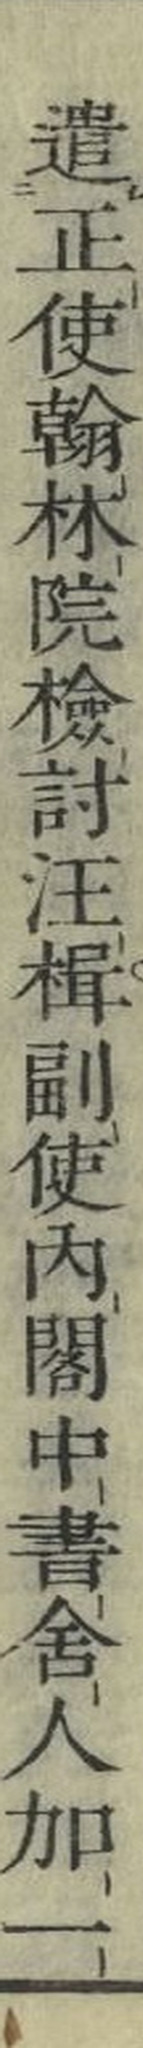遣正-使翰-林-院検-討汪-楫。副-使内-閣中-書-舎-人加-一-

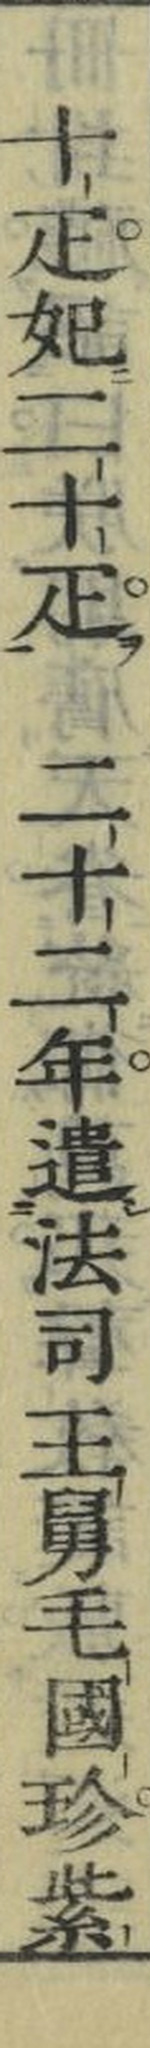十-疋。妃二-十-疋。二-十-二-年。遣法司王-舅毛-国-珍。紫-

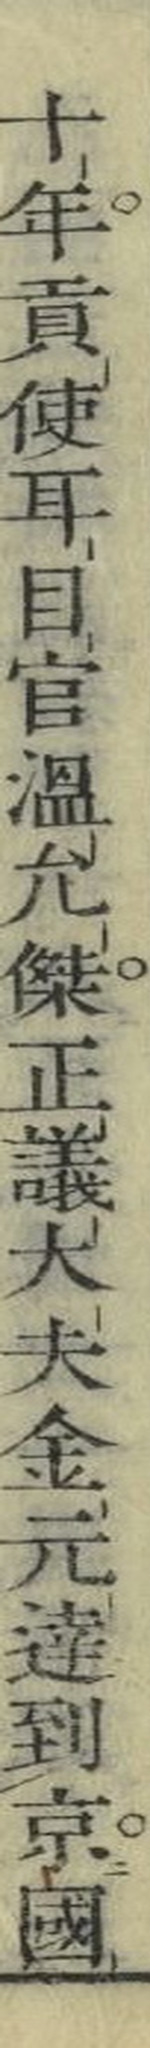十-年。貢-使耳-目-官温-允-傑。正-議-大-夫金-元-達到京。国-
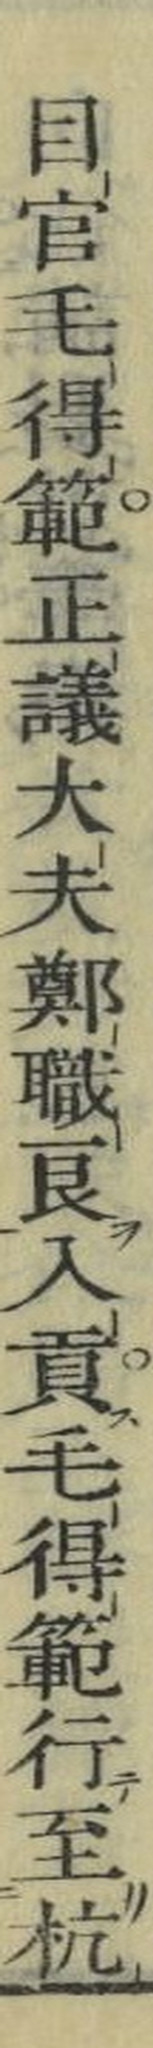目-官毛-得-範。正-議大-夫鄭-職-良入-貢。毛-得-範行至杭-
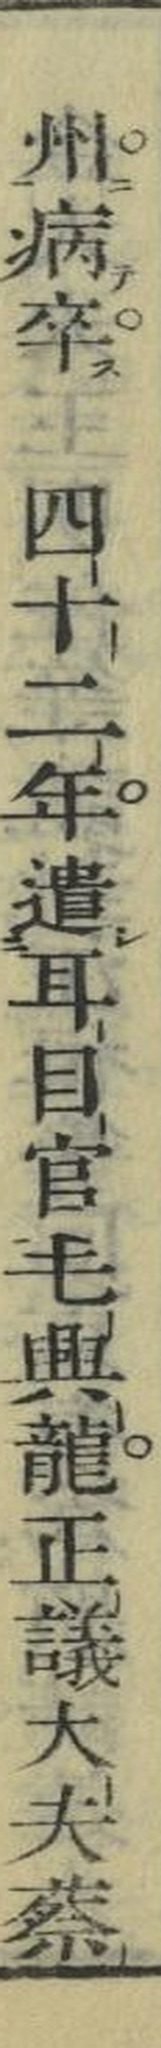州。病卒。四-十-二-年。遣耳-目-官毛-興-竜。正-議大-夫蔡-
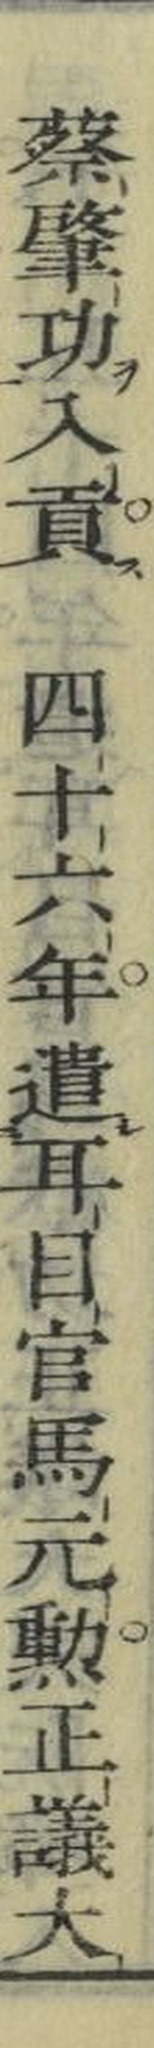蔡-肇-功入-貢。四-十-六-年。遣耳-目-官馬-元-勲。正-議大-
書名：中山伝信録 巻三
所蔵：University of the Ryukyus Library
